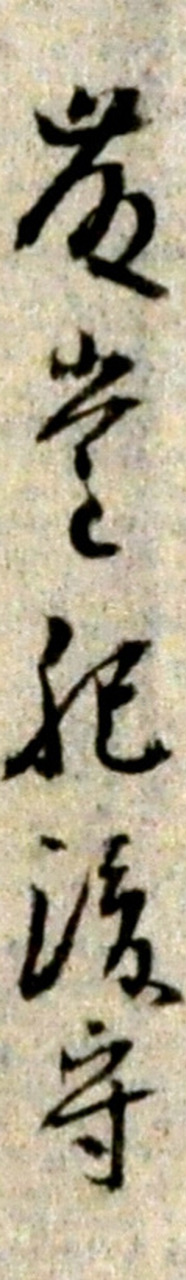藤堂肥後守
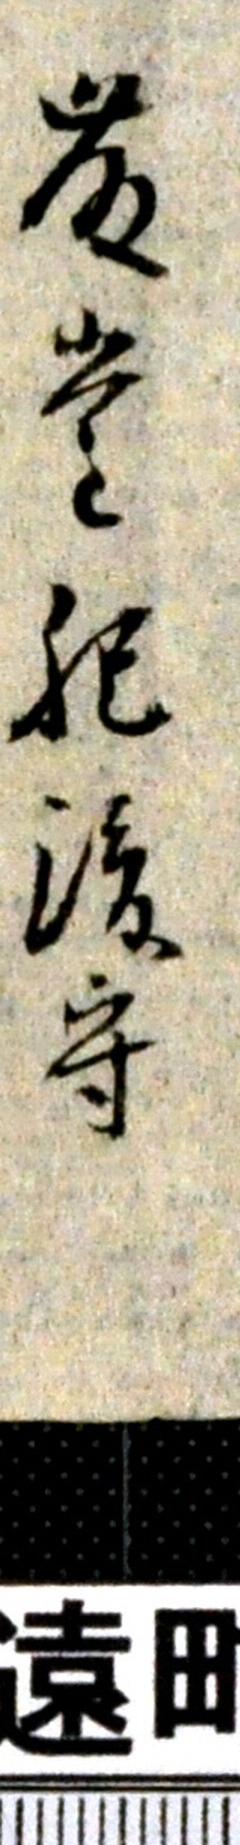藤堂肥後守

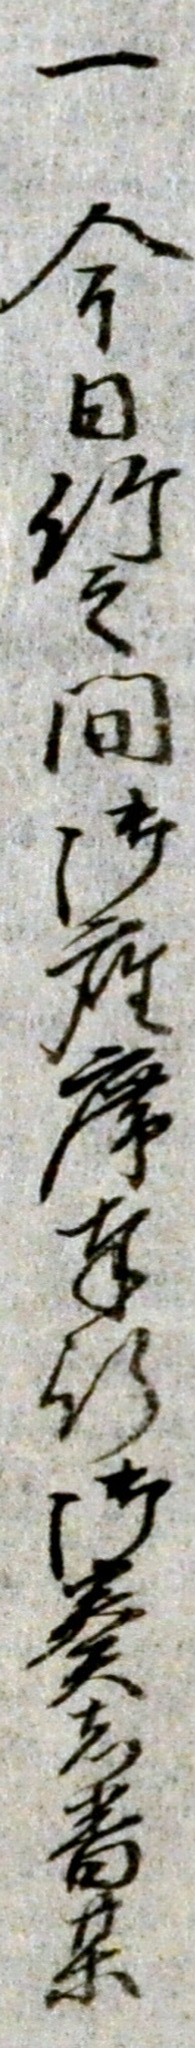一今日竹之間御座席奉行御奏者番某
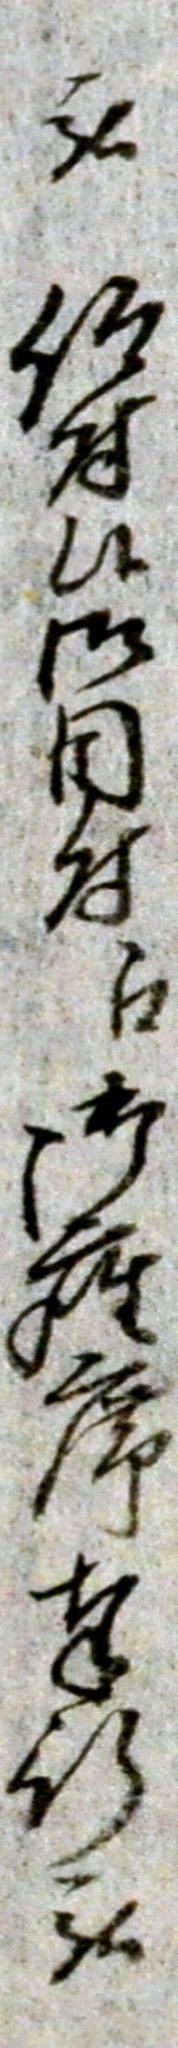被仰付候御目付え御座席奉行被
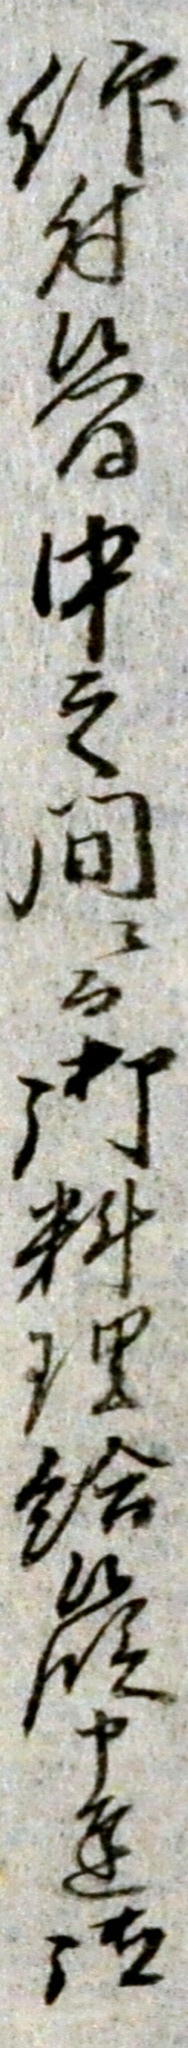仰付候間中之間ニ而御料理給候段申達御
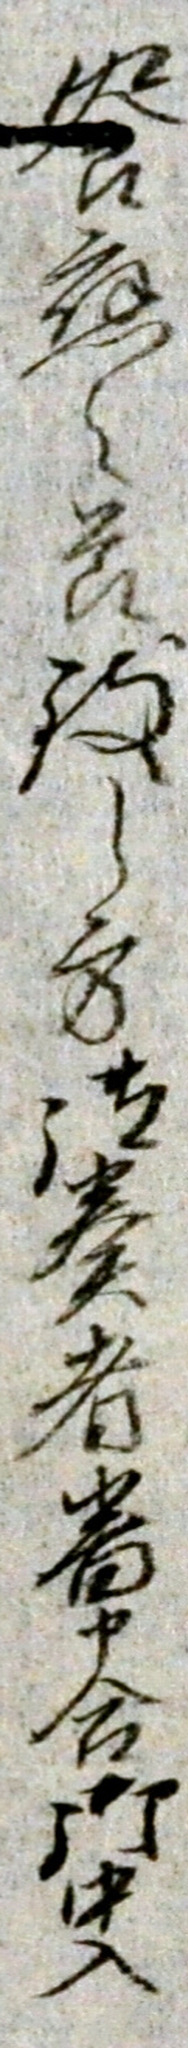饗應之節致し方御奏者番申合御中入
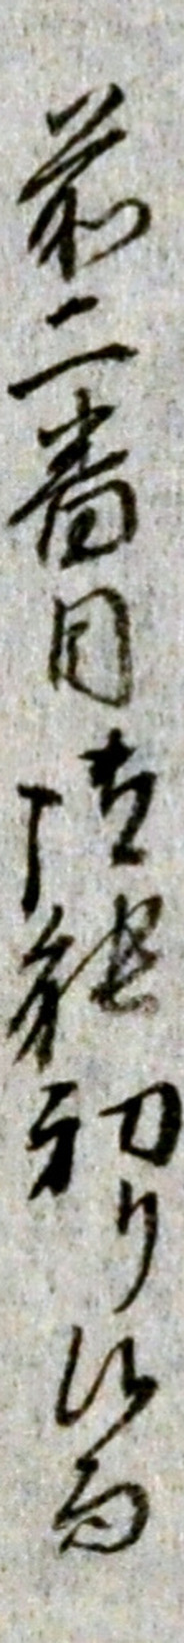前二番目御能初り候而
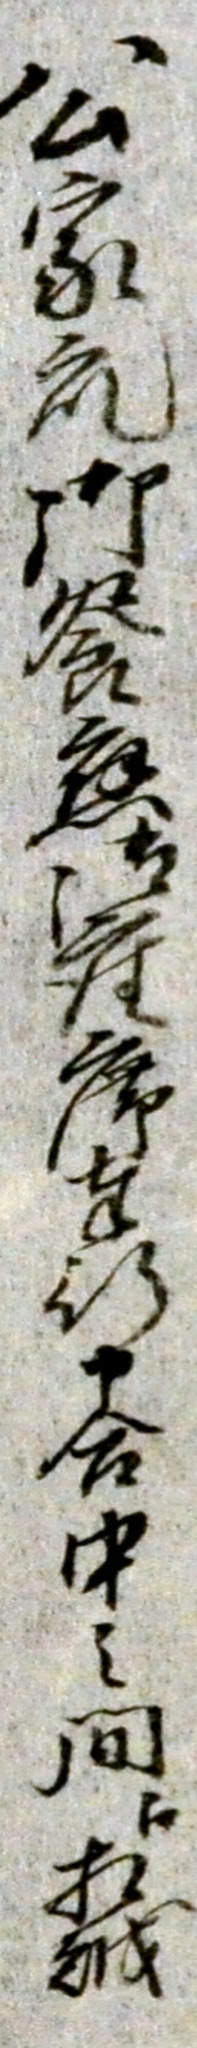公家衆御饗應御座席奉行申合中之間え相越
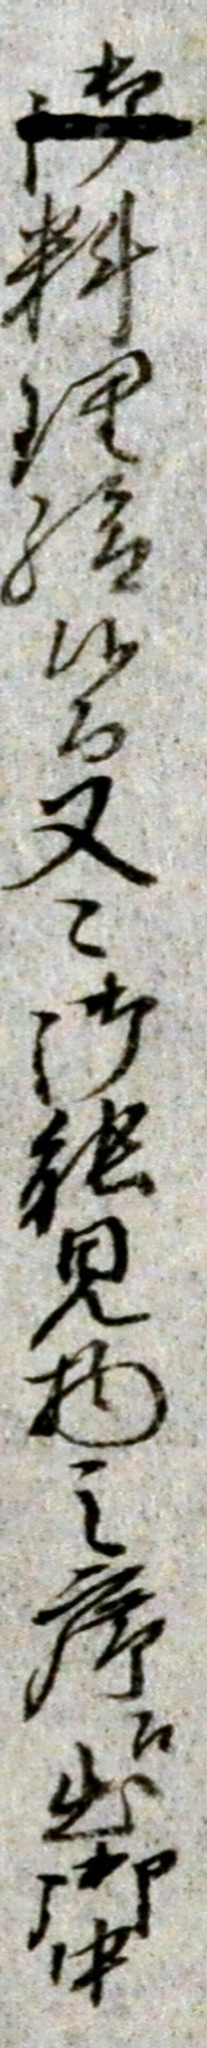御料理給候而又々御能見物之席え出御中
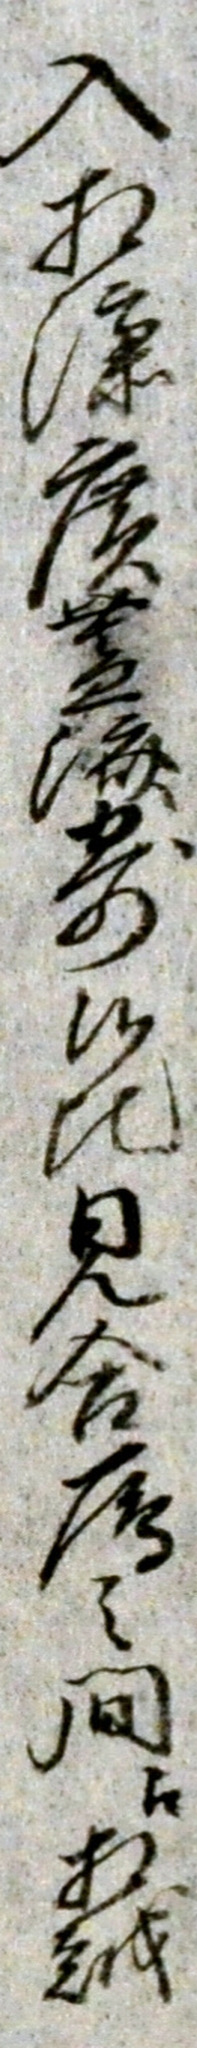入相済廣蓋済寄候比見合雁之間え相越
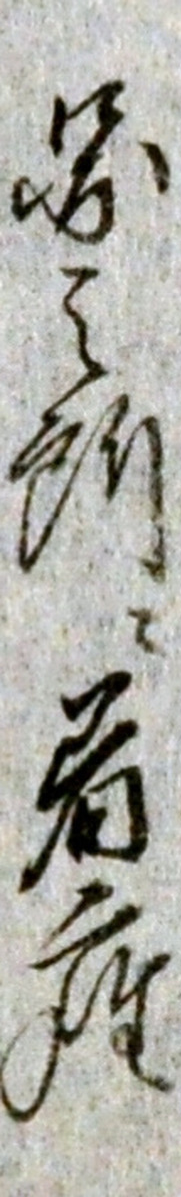圖之所ニ着座

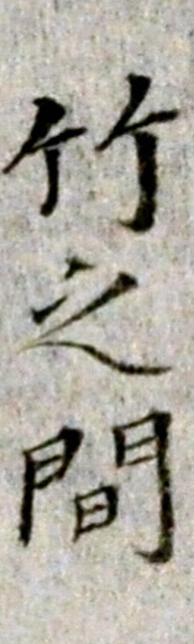竹之間
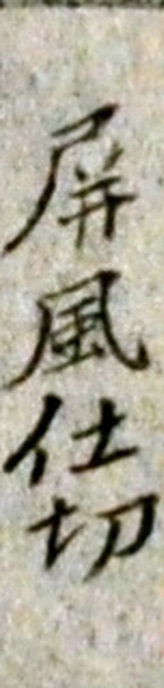屏風仕切
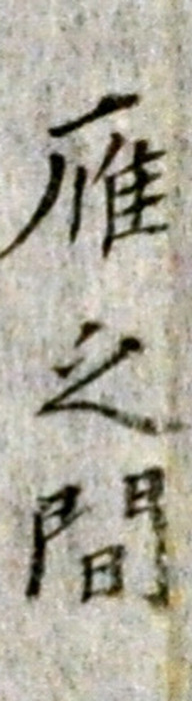雁之間
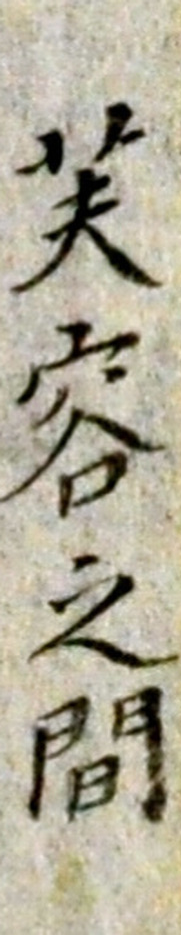芙蓉之間
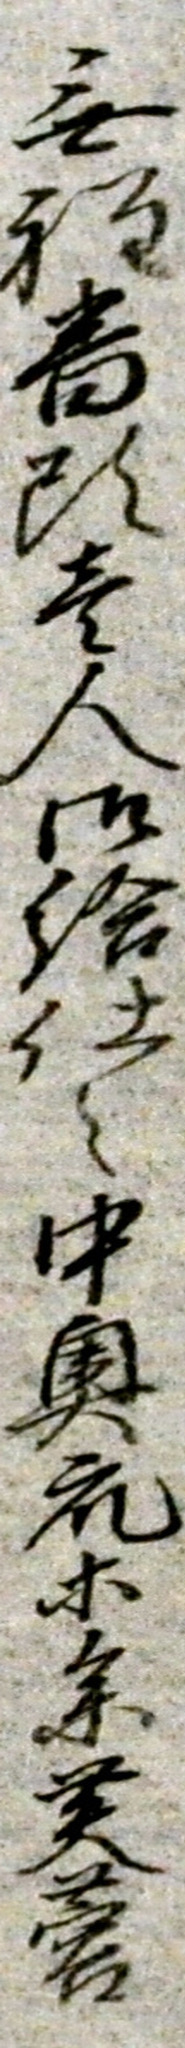無程番頭壱人御給仕之中奥衆等参芙蓉
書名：竹ノ間御座席奉行勤方控外
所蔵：伊那市立高遠町図書館・合同会社AMANE
